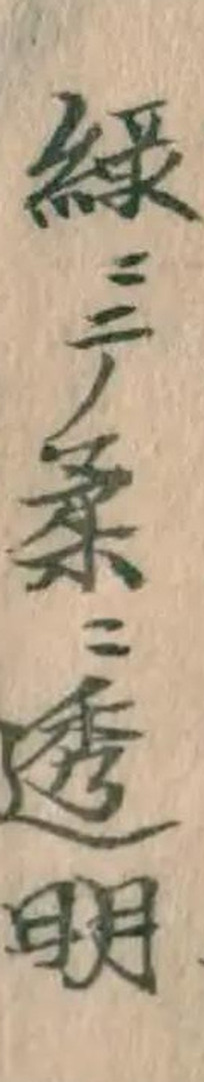緑ニテ柔ニ透明
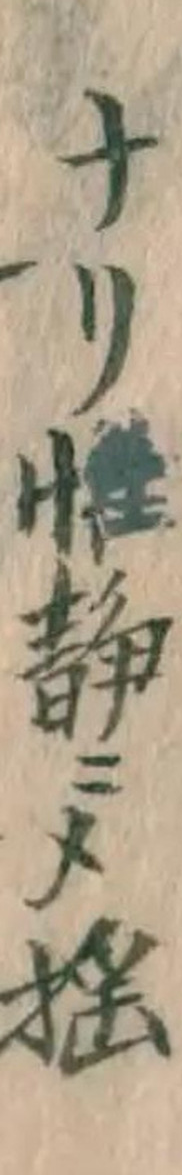ナリ性静ニシテ揺
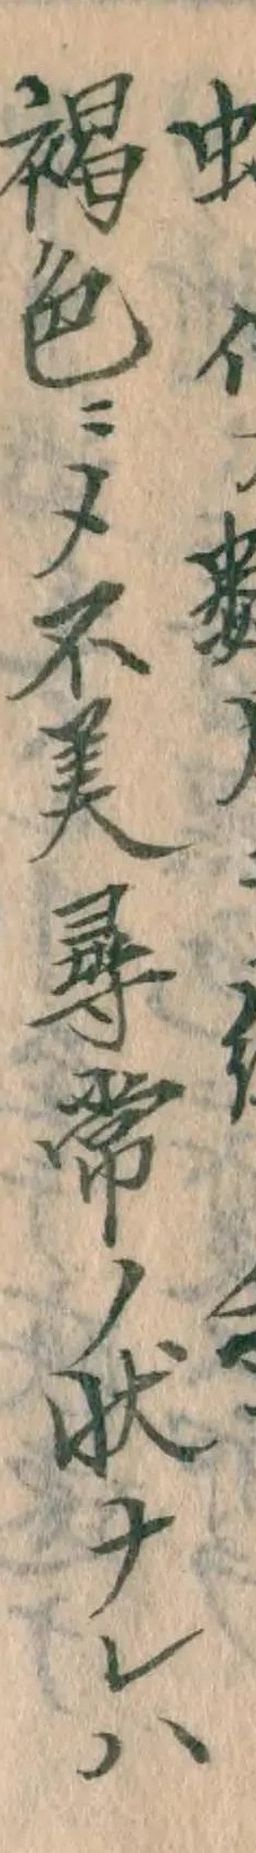褐色ニシテ不美尋常ノ状ナレハ
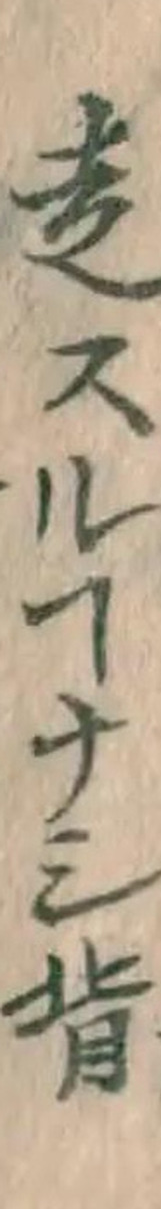走スルコトナシ背
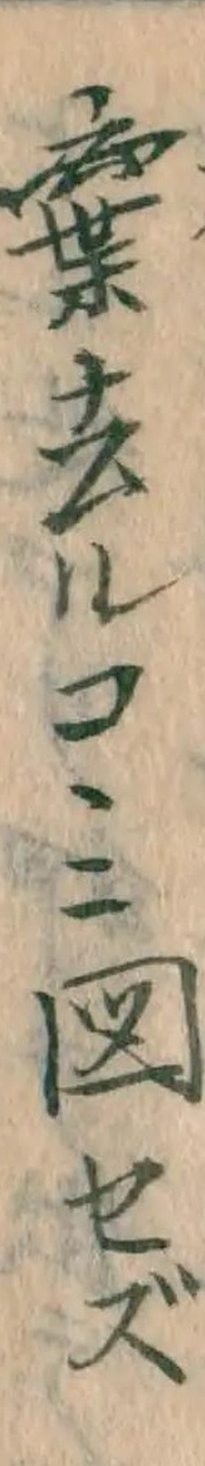棄去ルコヽニ図セズ
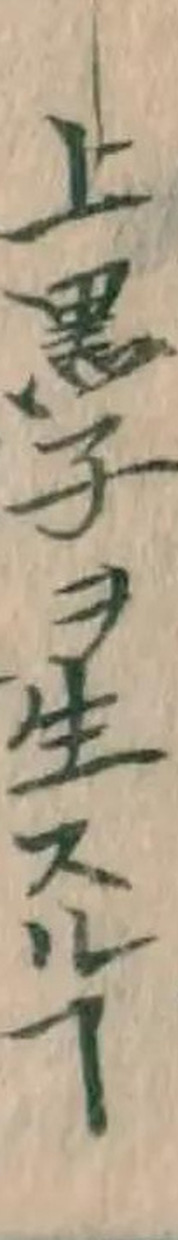上黒子ヲ生スルコト
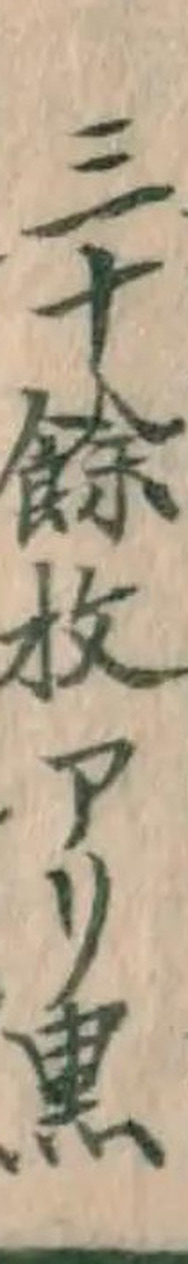三十余枚アリ黒
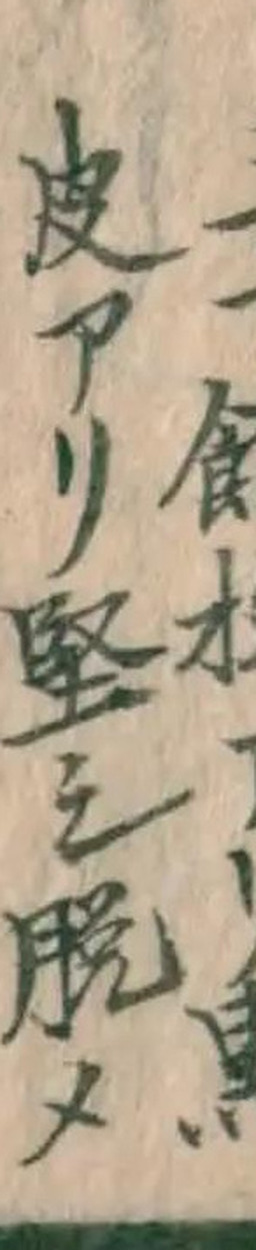皮アリ堅シ脱シテ
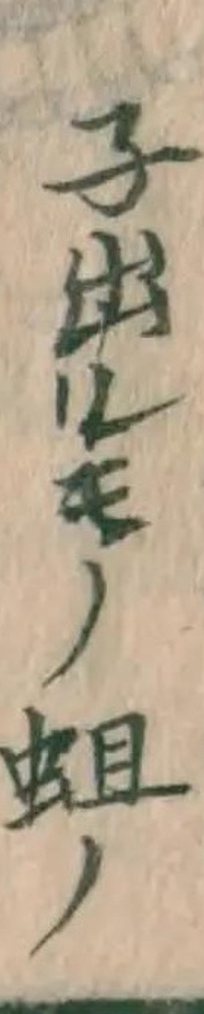子出ルモノ蛆ノ
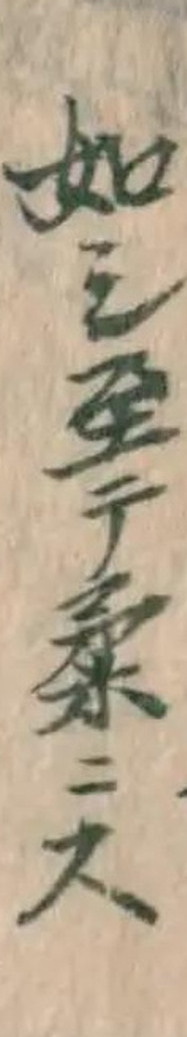如シ至テ柔ニス
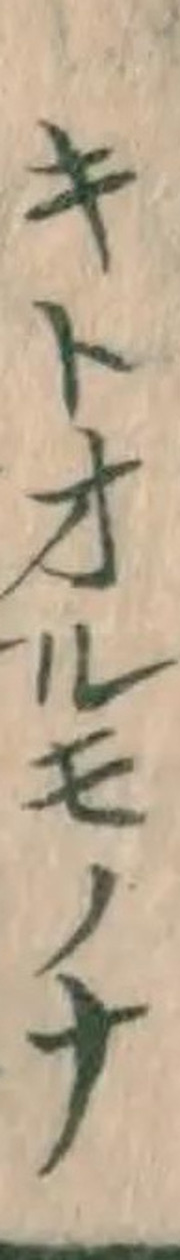キトオルモノナ
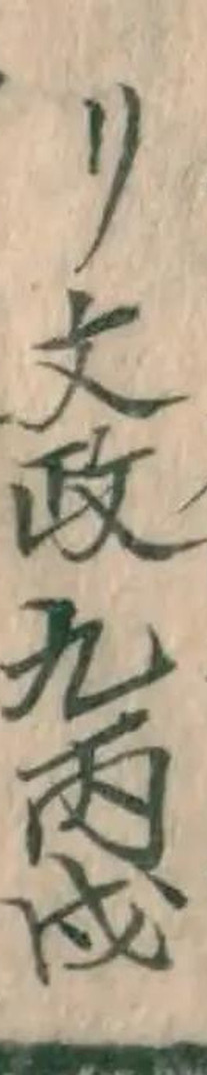リ文政九丙戌
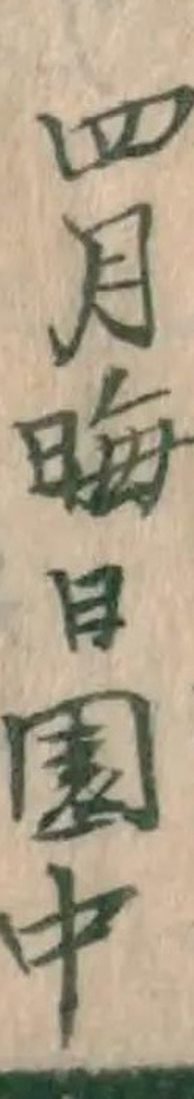四月晦日園中
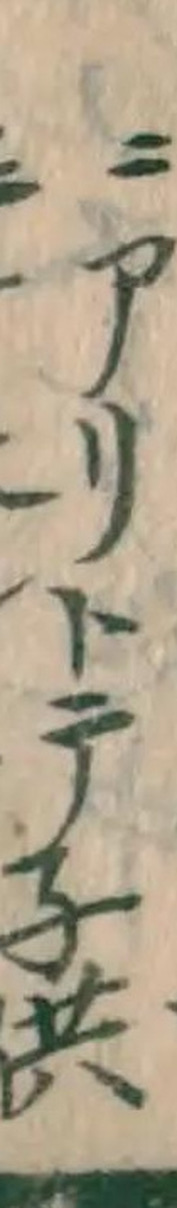ニアリトテ子供
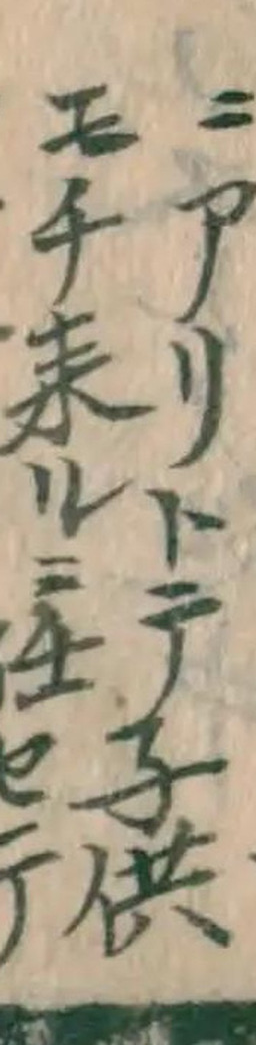モチ来ルニ任セテ
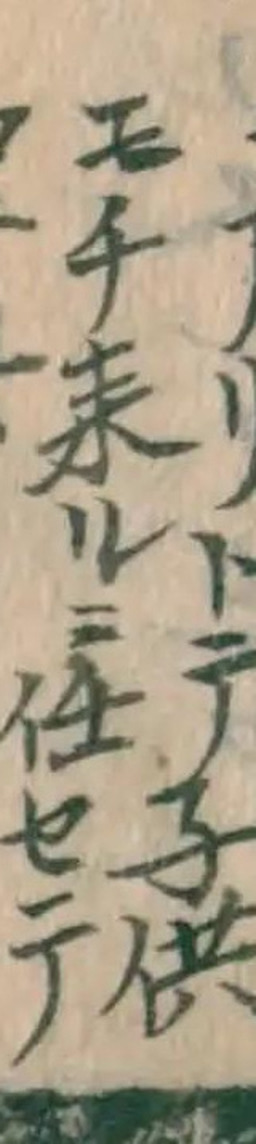モチ来ルニ任セテ
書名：千蟲譜 3巻. [3]
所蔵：国立国会図書館 National Diet Library, JAPAN
